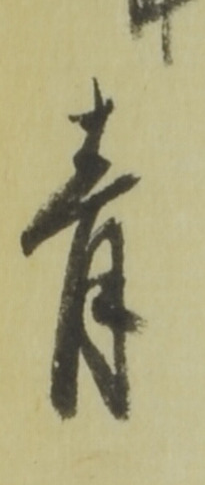十二月
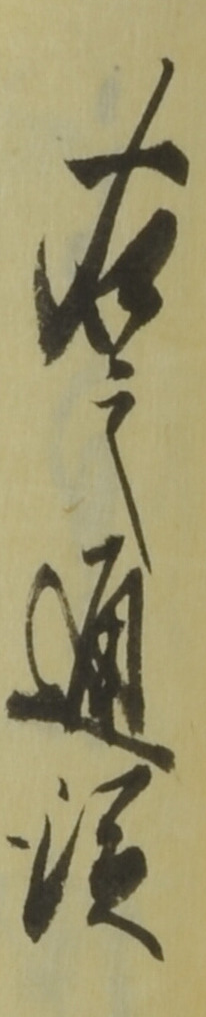右之通従
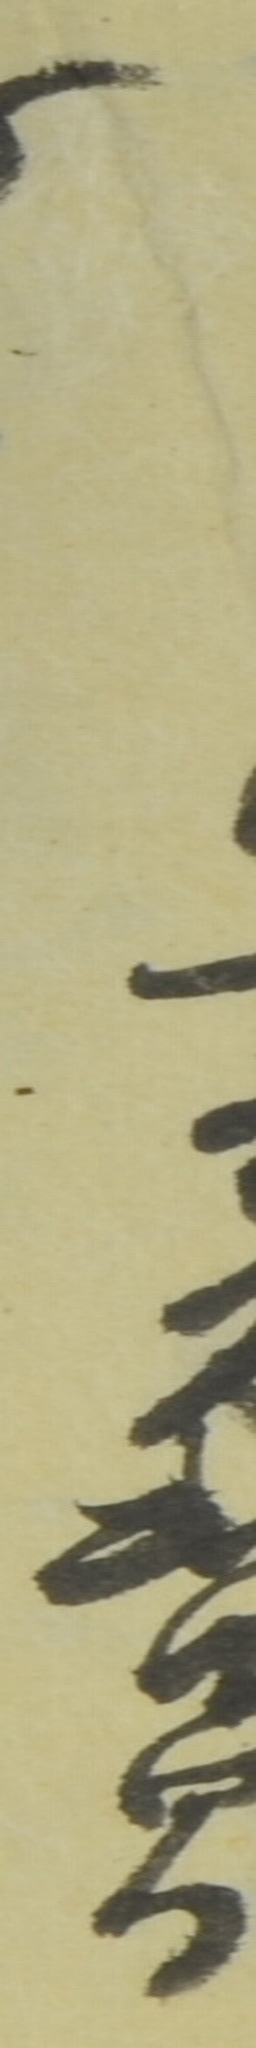十二月
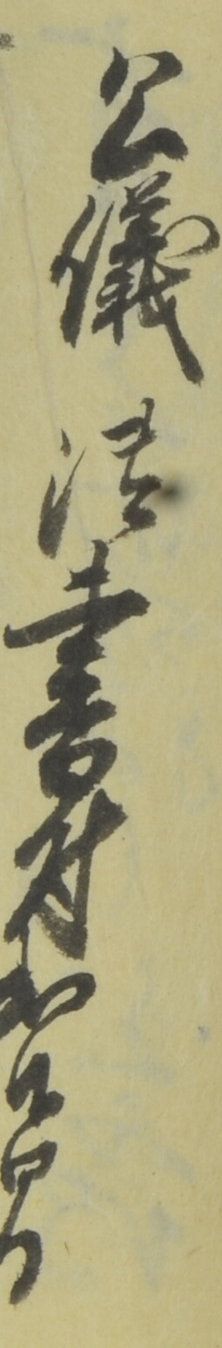公儀御書付出候間

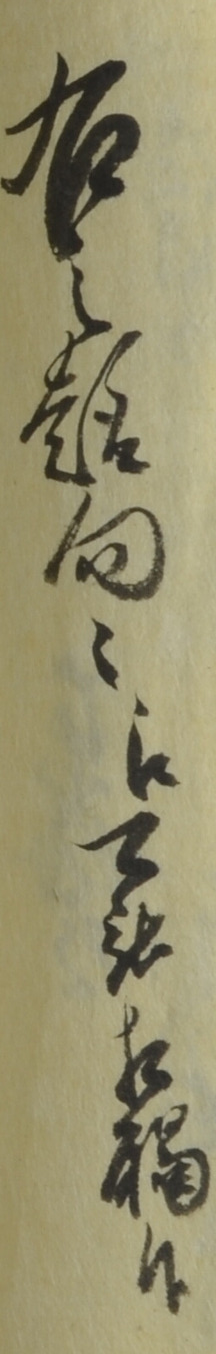右之趣向々江可被相触候
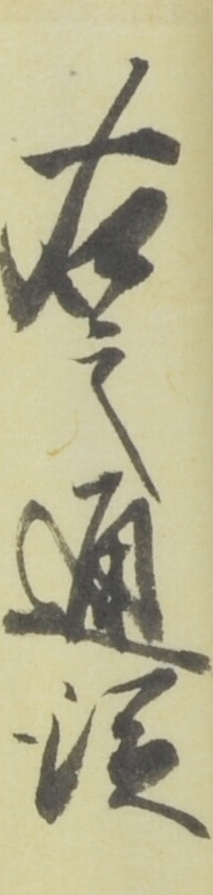右之通従
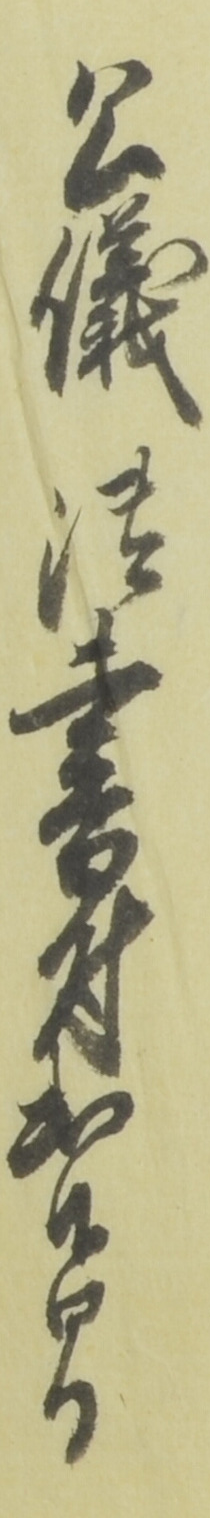公儀御書付出候間
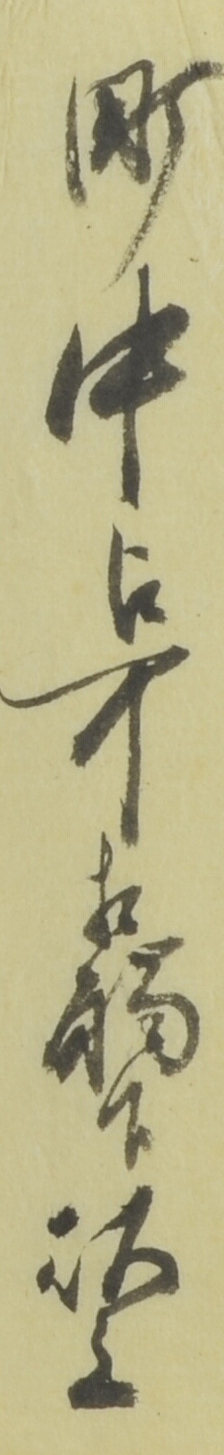町中江可相触候以上
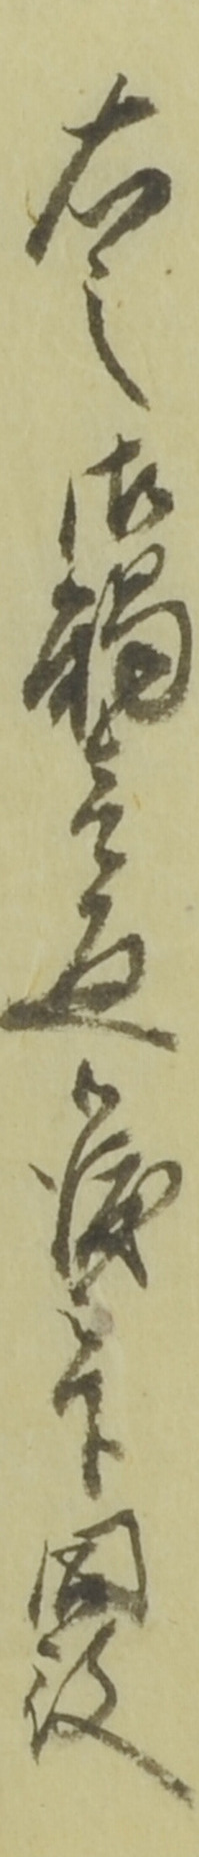右之御触壱通御渡被下同役
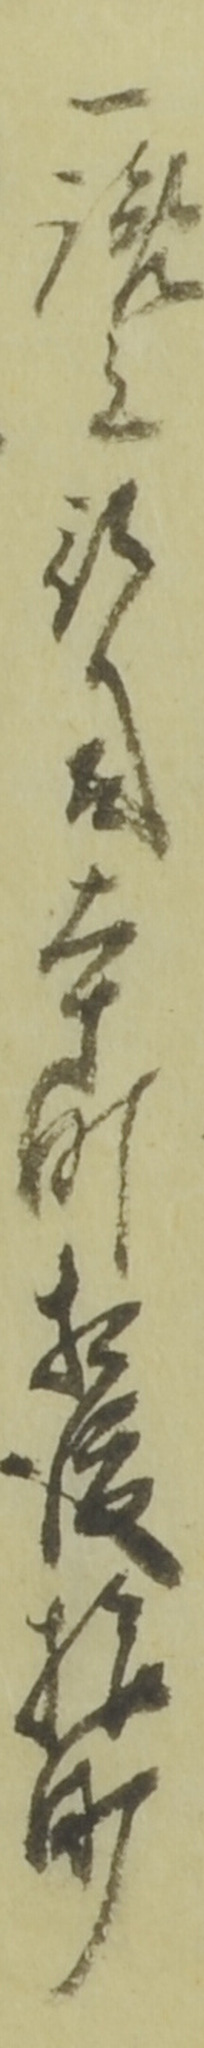一覧上行司寺町相渡拾町
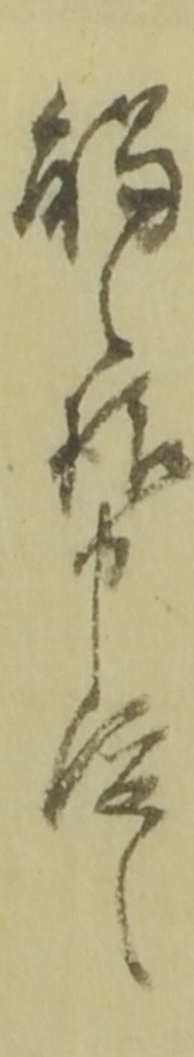触候様申渡候
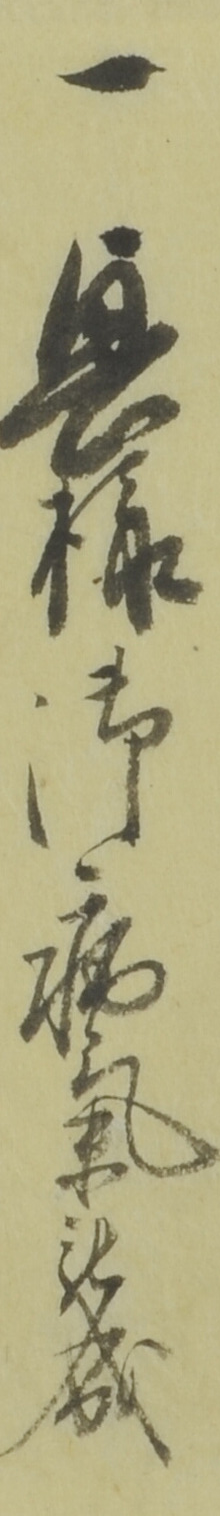一奥様御病気被成
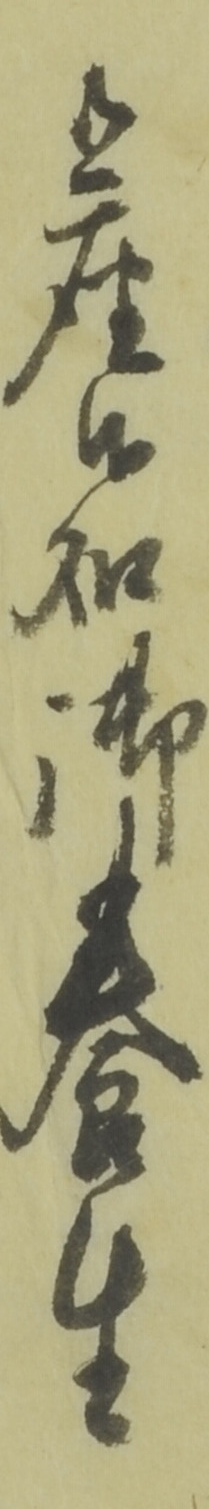御座候処養生
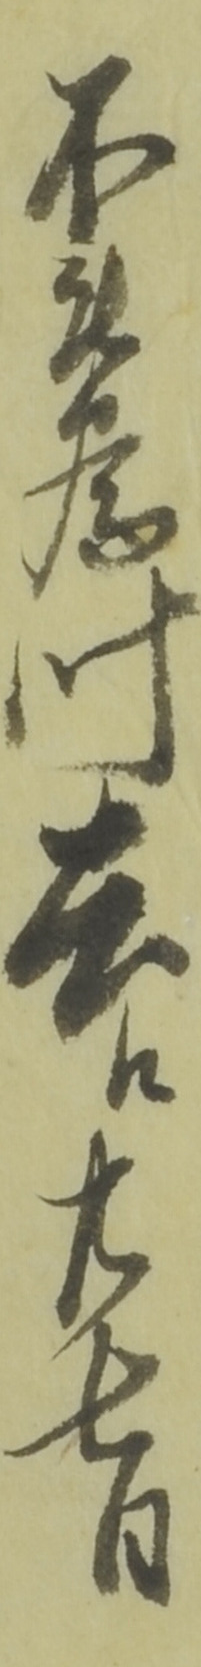不被為叶去ル廿七日
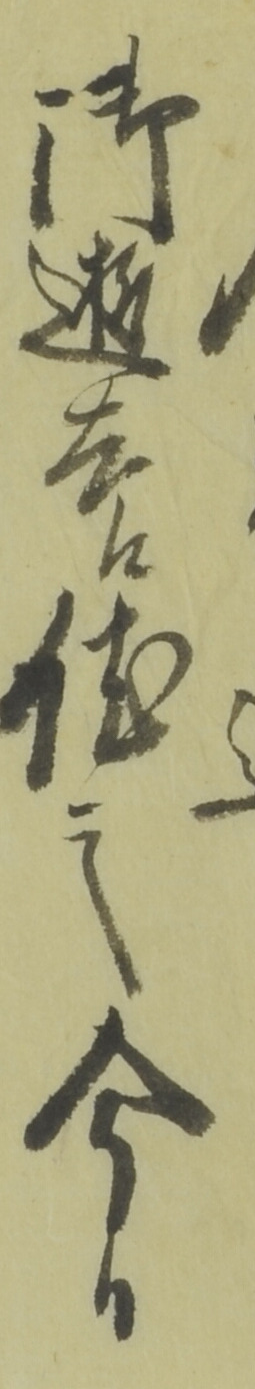御逝去候依之今日
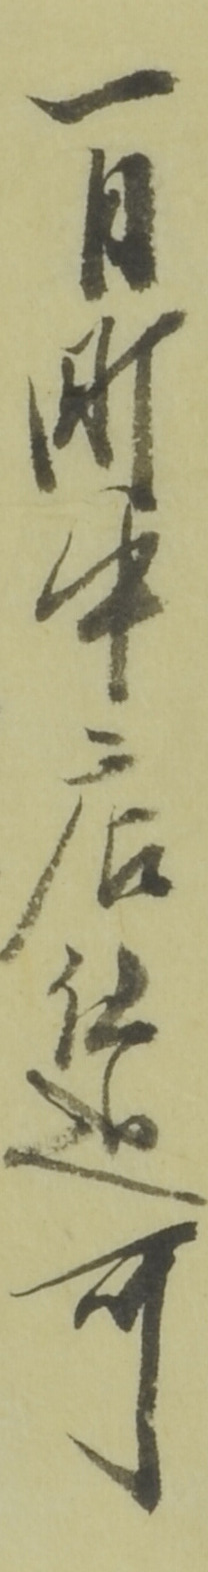一日町中店仕廻可
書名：御触書御書附控
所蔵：伊那市立高遠町図書館・合同会社AMANE
